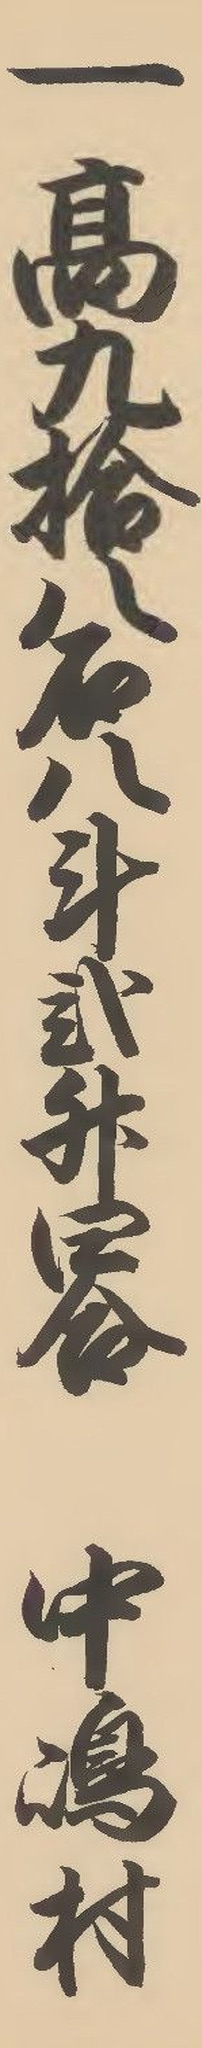一髙九拾八石八斗弐升四合中嶋村
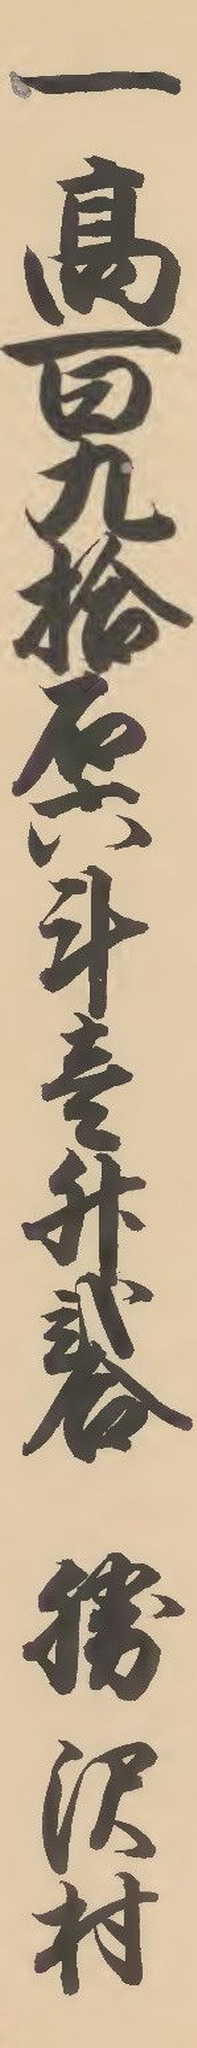一髙百九拾石六斗壱升弐合勝沢村

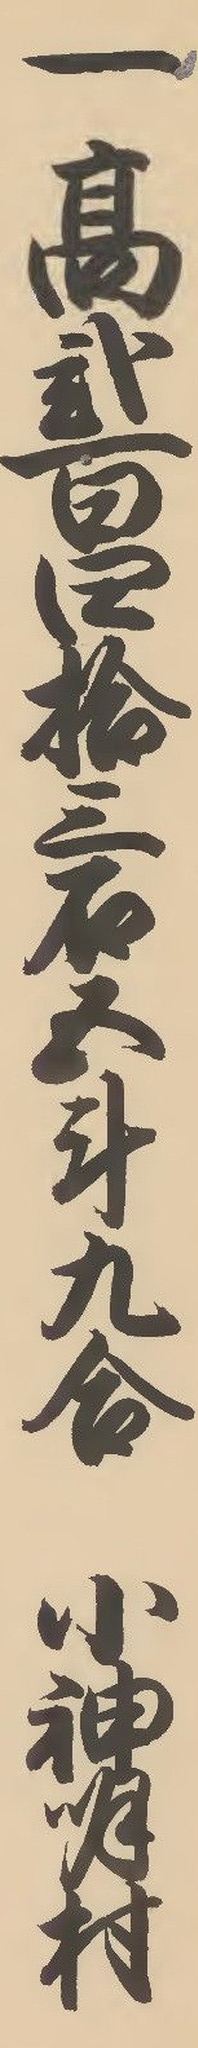一髙弐百四拾三石五斗九合小神明村
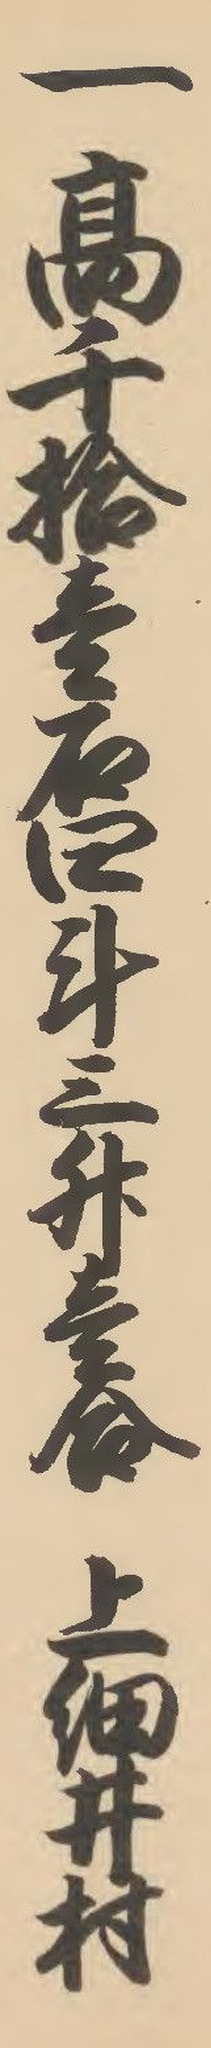一髙千拾壱石四斗三升壱合上細井村
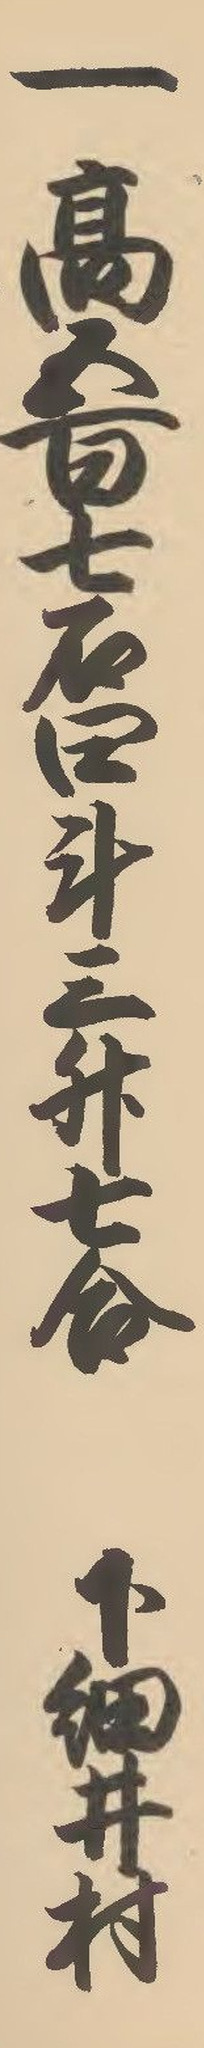一髙五百七石四斗三升七合下細井村
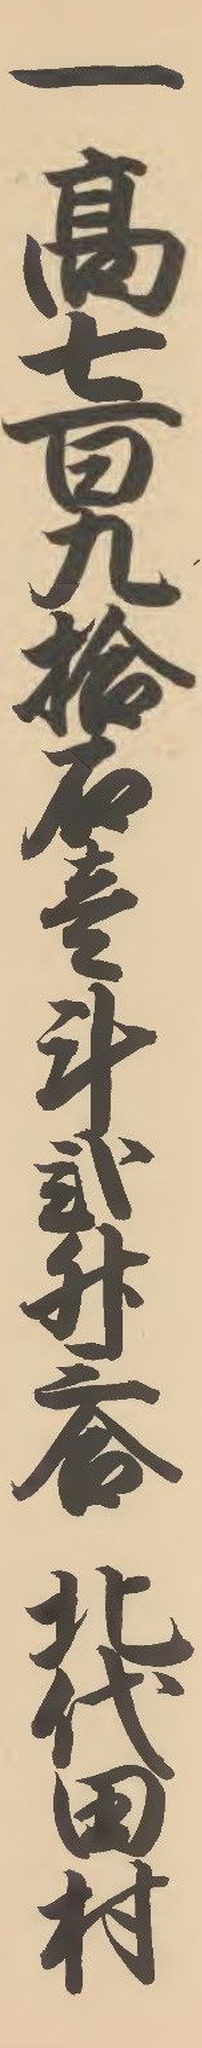一髙七百九拾石壱斗弐升三合北代田村
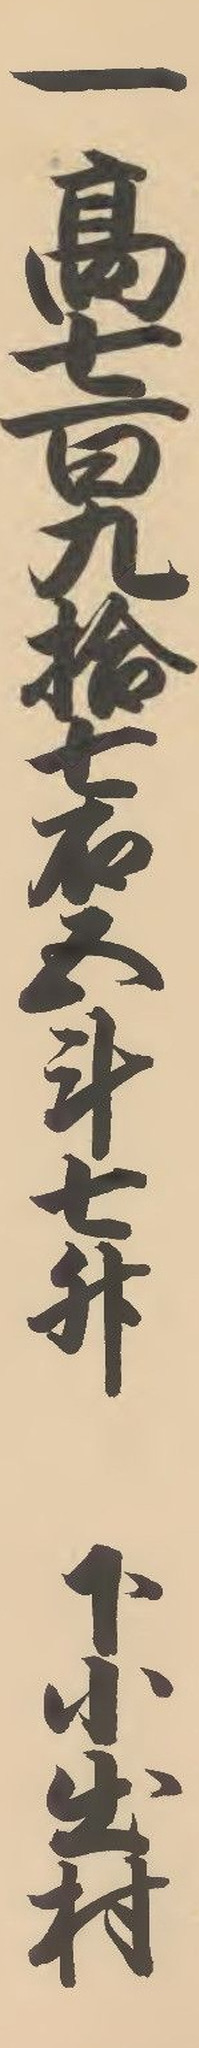一髙七百九拾七石五斗七升下小出村
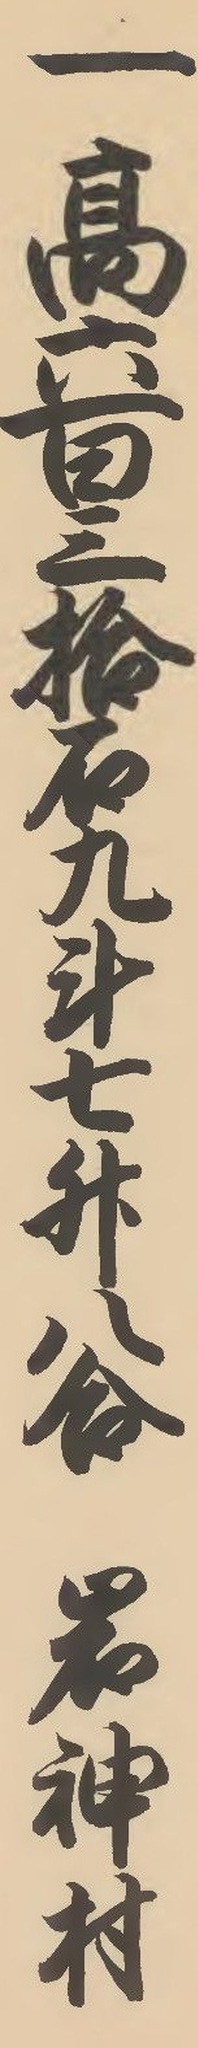一髙六百三拾石九斗七升八合岩神村
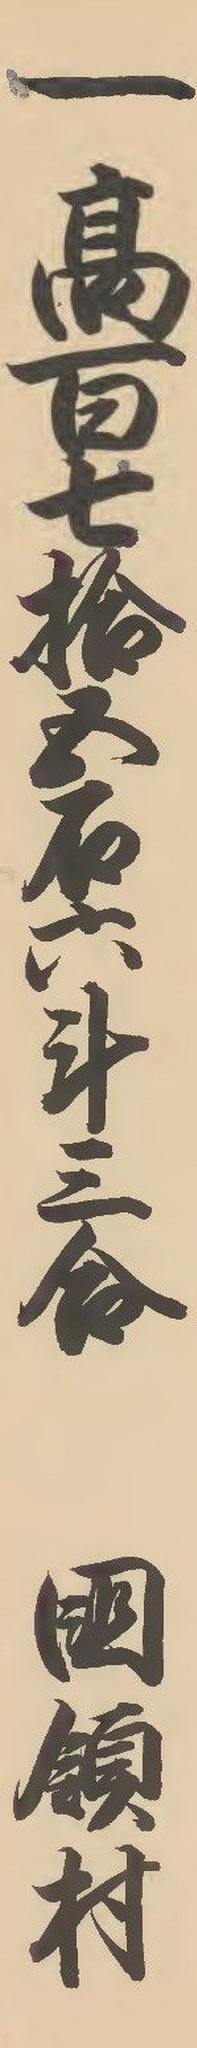一髙百七拾五石六斗三合国領村

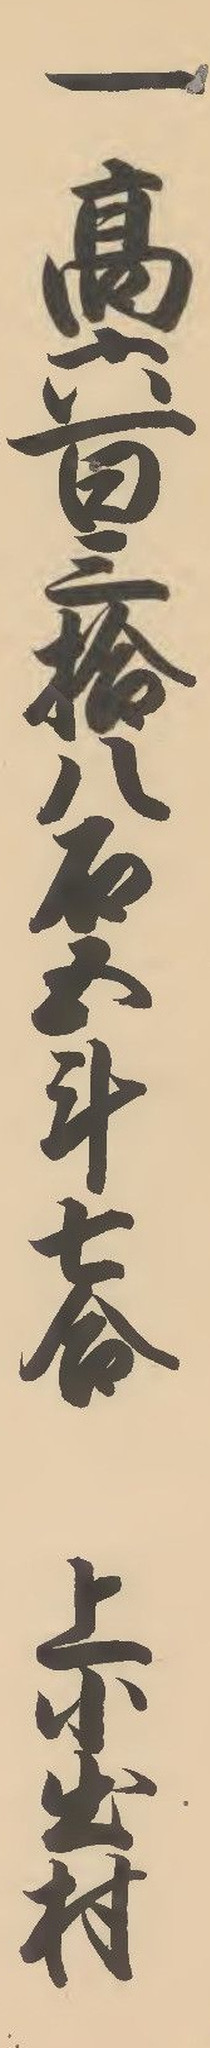一髙六百三拾八石五斗七合上小出村
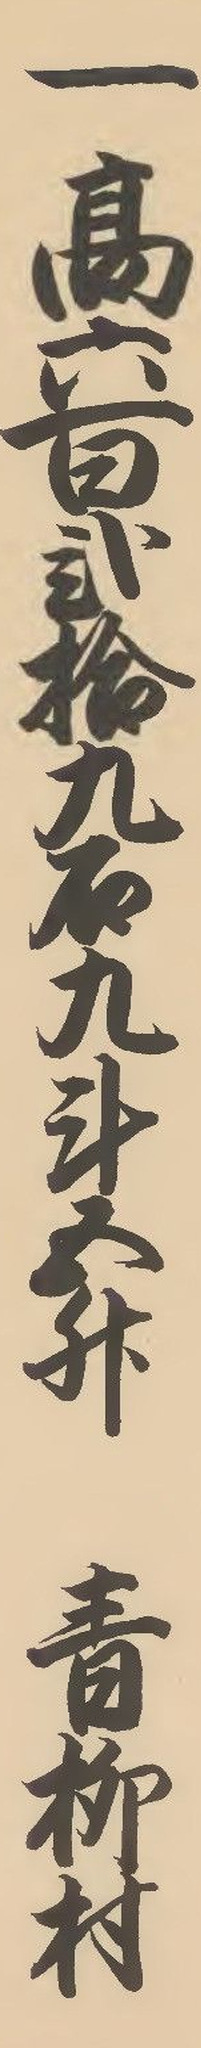一髙六百弐拾九石九斗五升青柳村
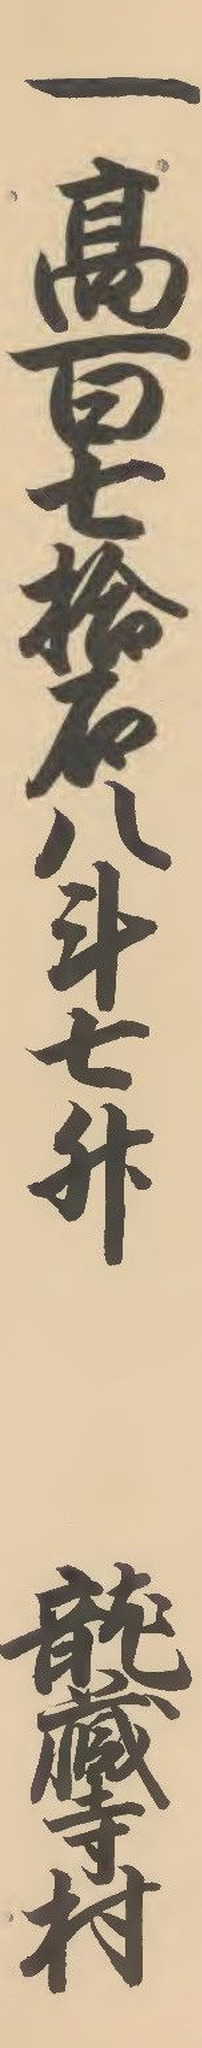一髙百七拾石八斗七升龍藏寺村
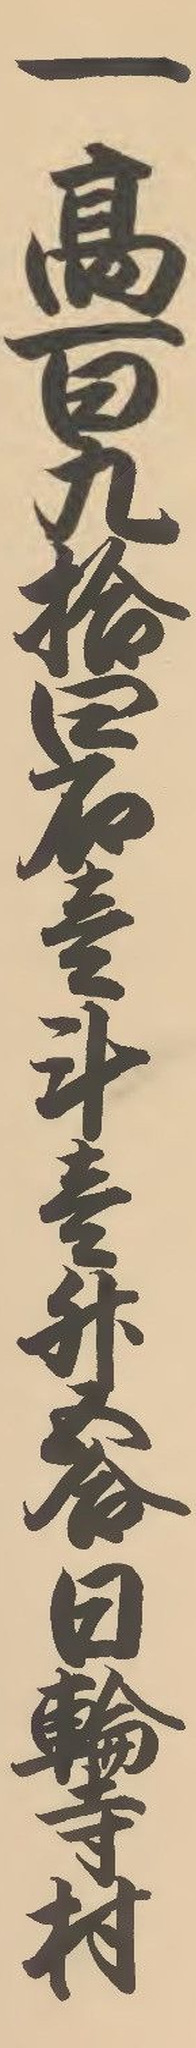一髙百九拾四石壱斗壱升五合日輪寺村
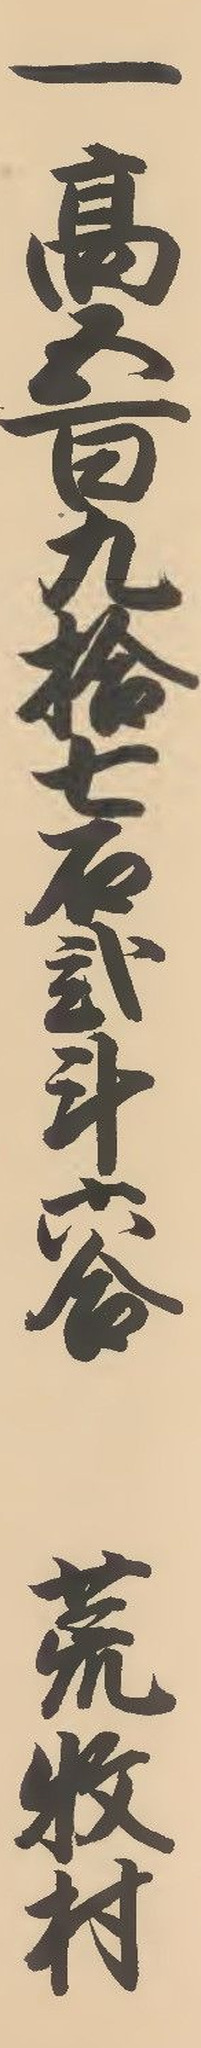一髙五百九拾七石弐斗六合荒牧村
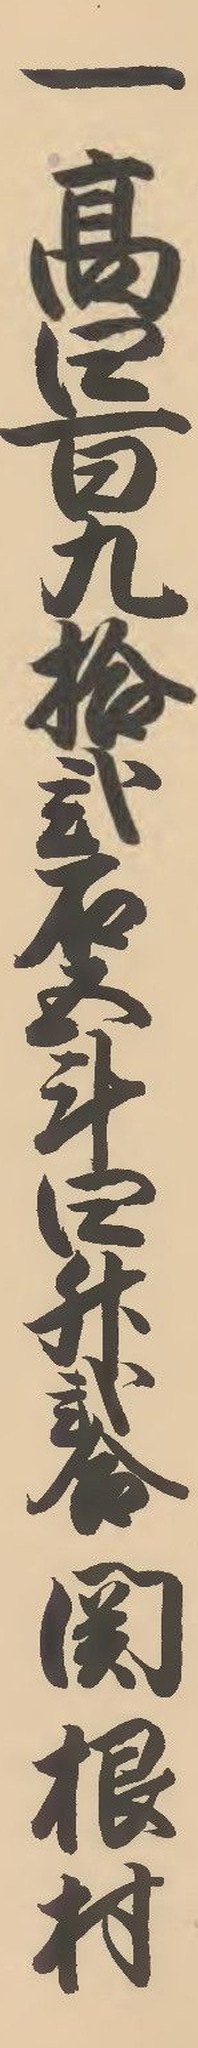一髙四百九拾壱石五斗四升弐合関根村
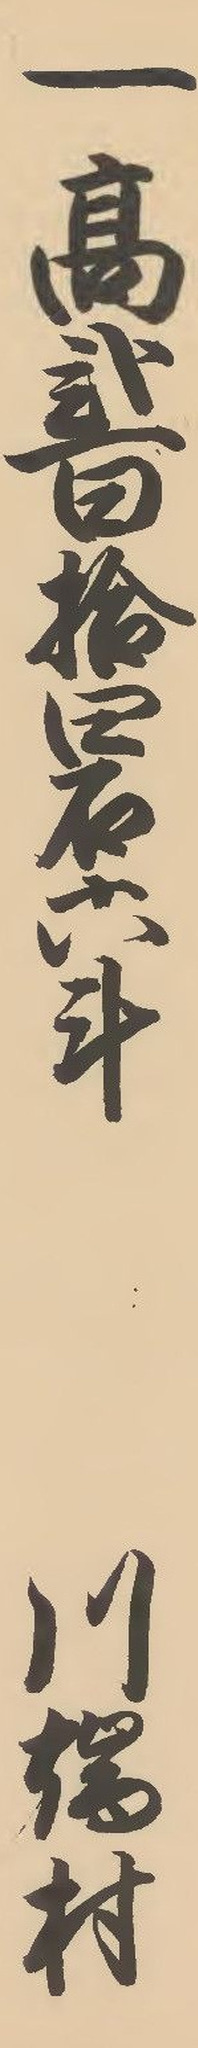一髙弐百拾四石六斗川端村
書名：上野国郷帳
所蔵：国立公文書館 National Archives of Japan
